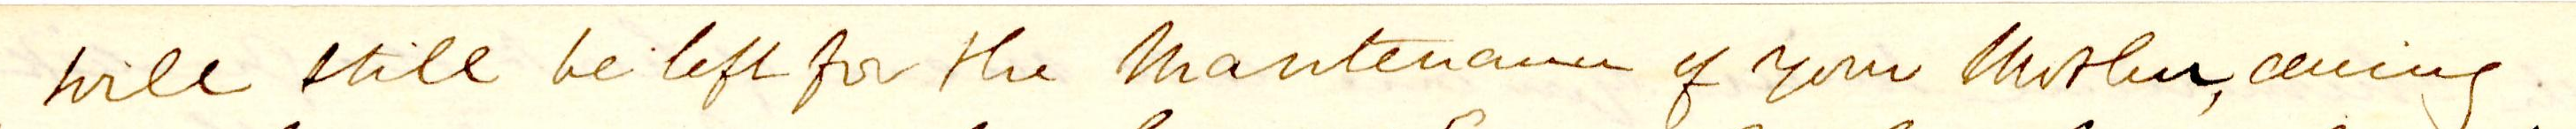will still be left for the maintenance of your Mother during
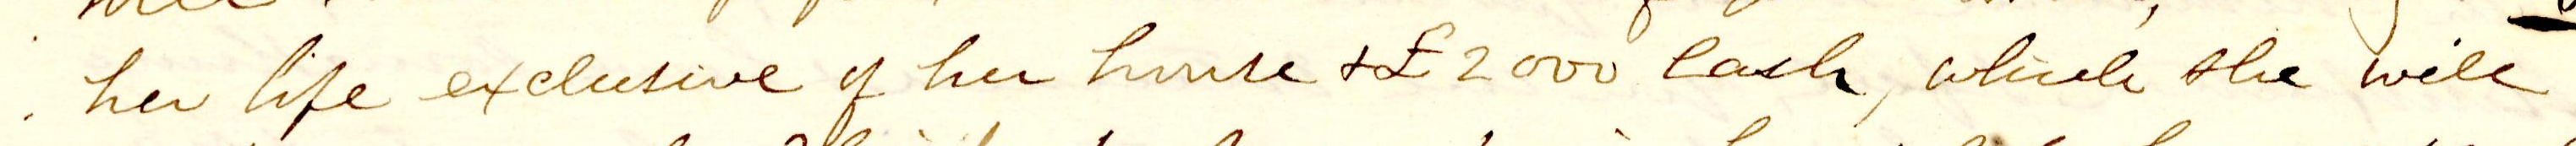her life exclusive of her house & £2000 each, which she will
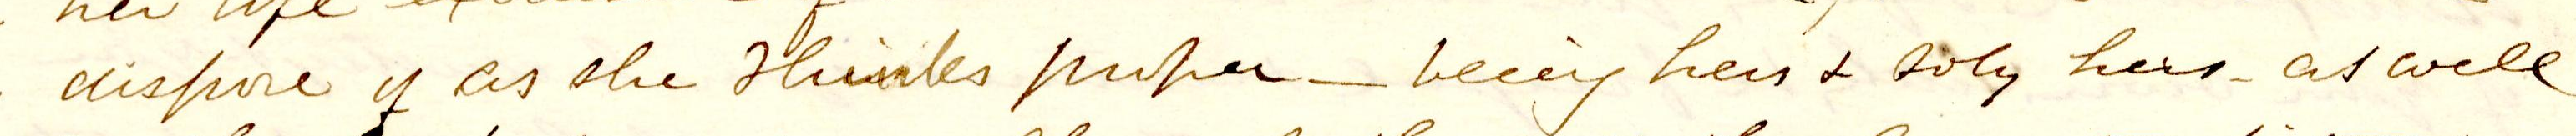dispose if as the houses prosper- being hers & soly hers as well
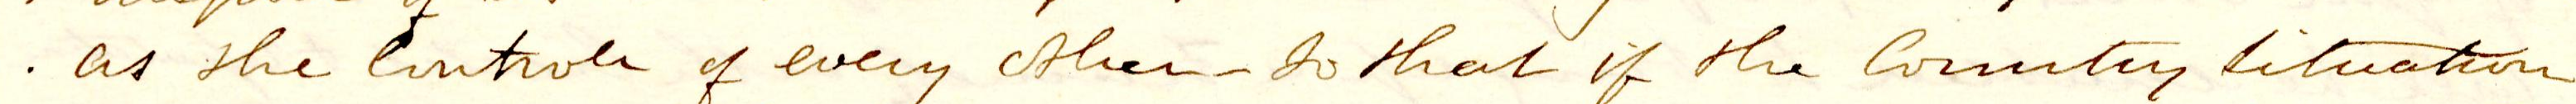as the Controll of every other.- So that if the Country Situation
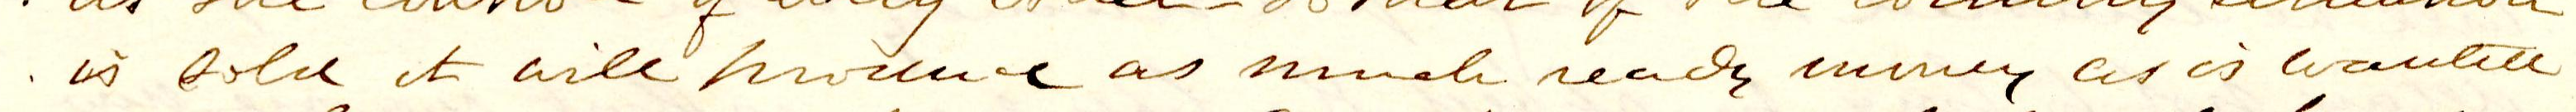is sold it will produce as much ready muney as is wanted
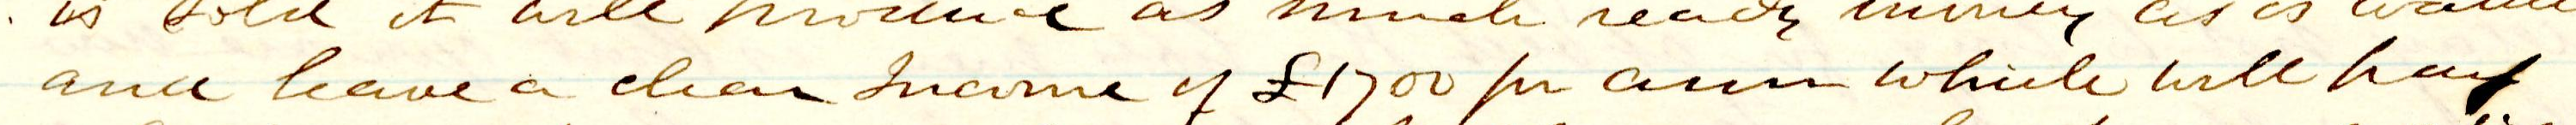and leave a clean income of £1700 per acre which will have
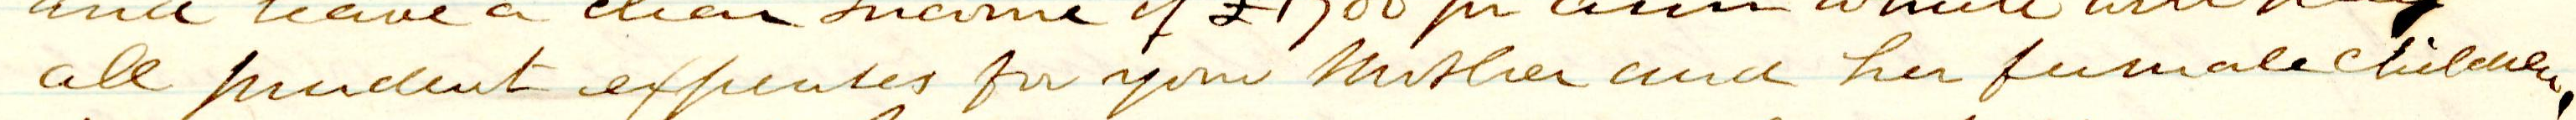all present expectes for your Mother and her fortunate children
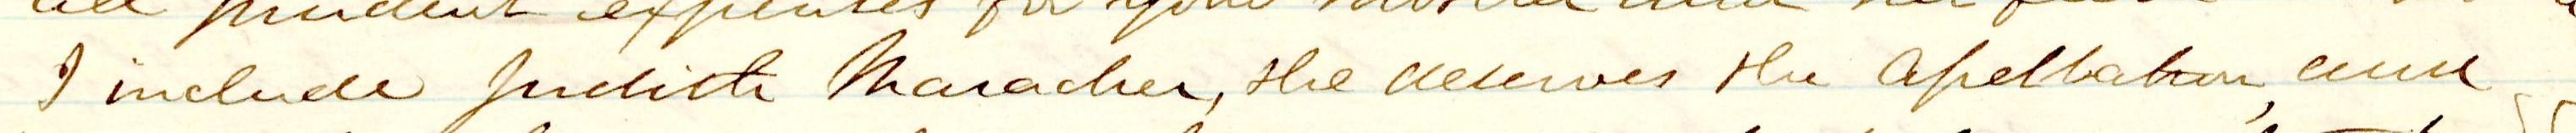I include Judith Maracher, she deserves the apellation and
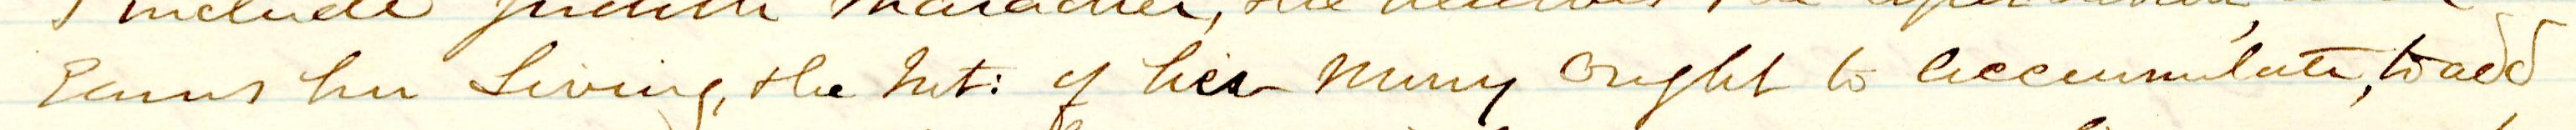Earns her living, the Int: of her money ought to accumulate, to add
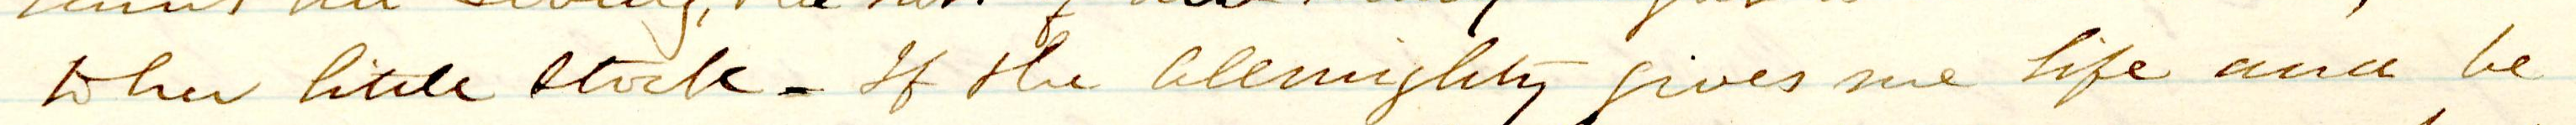to her little stock.- If the Allmighty gives me life and be
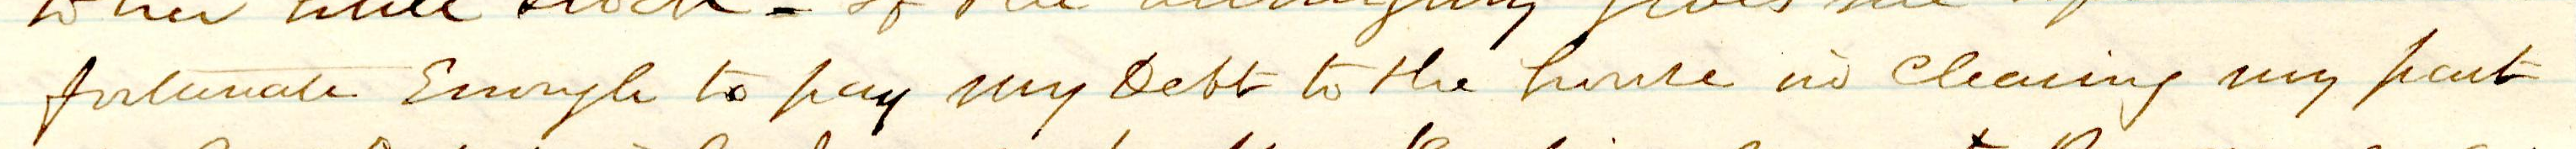fortunate Enough to pay my Debts to the fund in Clearing any part
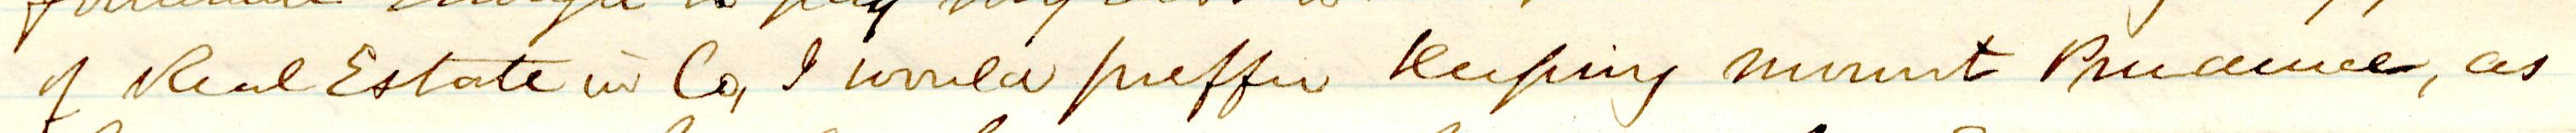of Real Estate in Co, I would preffer Keeping moment Prudence, as
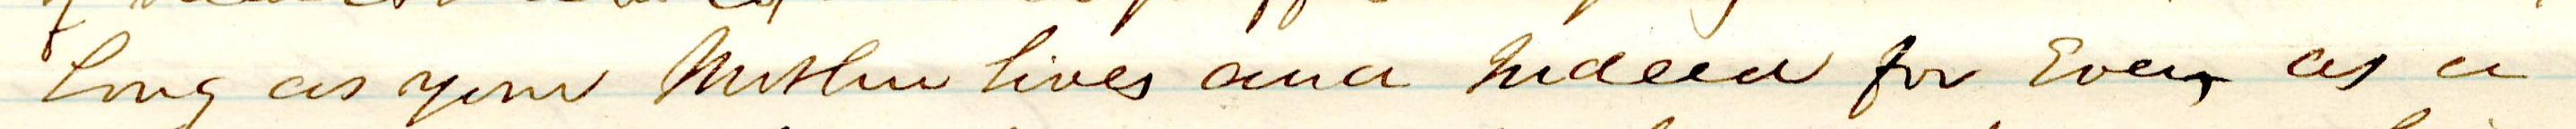long as your mother lives and Indeed for Ever as a
